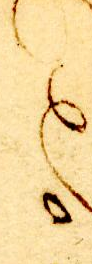To
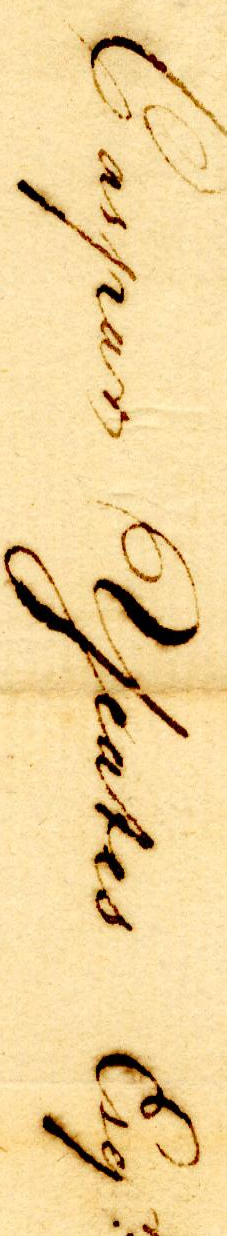Caspar Yeates Esq^r
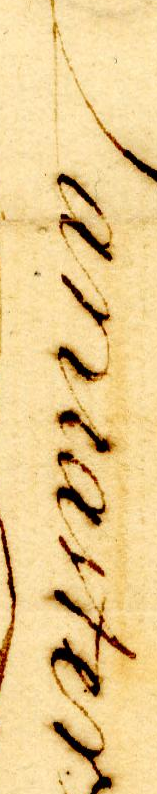Lancaster
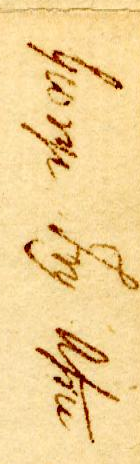George Fry Atrce
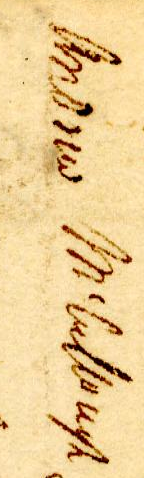Andrew M^cCullough
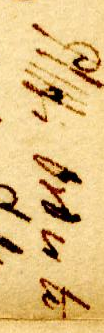Pllll Order to
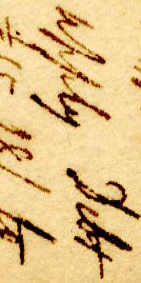Apply Debt
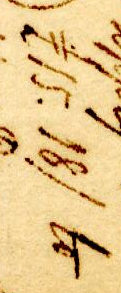£15. 18s to
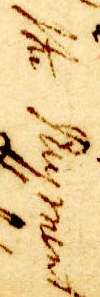the Payment
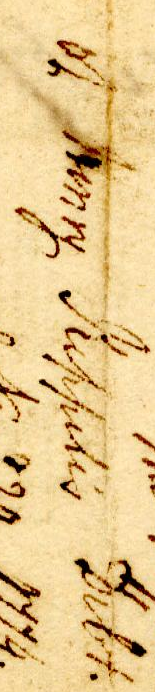of Henry Keppele's Debt.
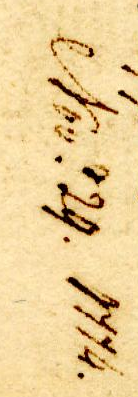Nov. 29. 1774.
